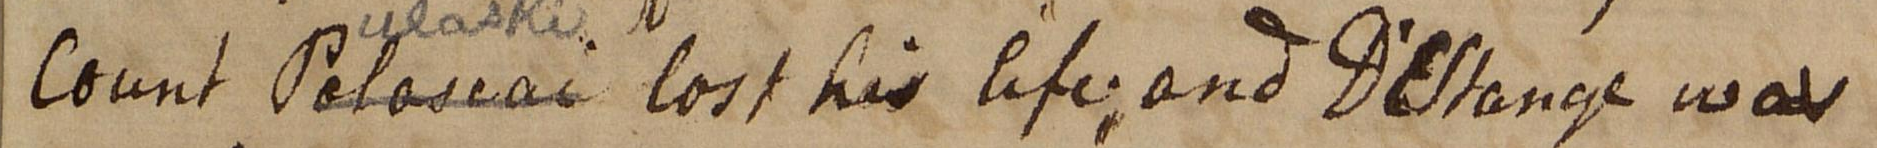Count Polascai lost his life; and D'EStange was
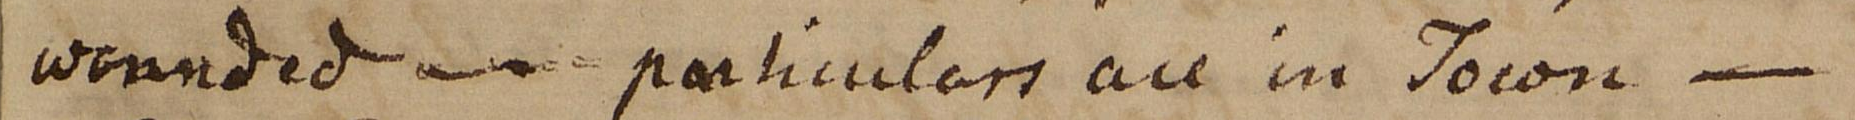wounded-- particulars are in Town-
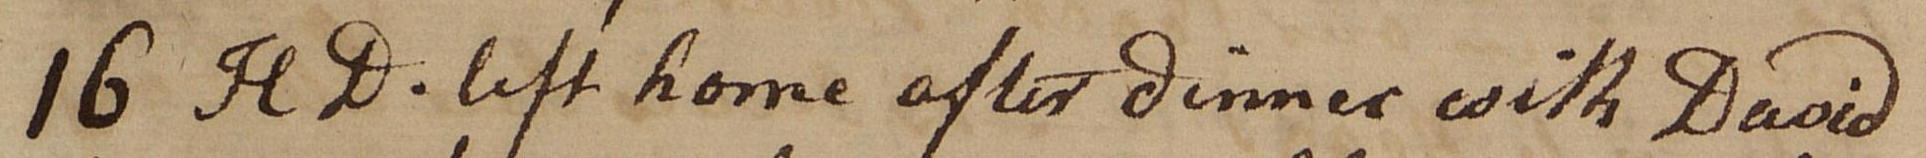16 HD. left home after dinner with David
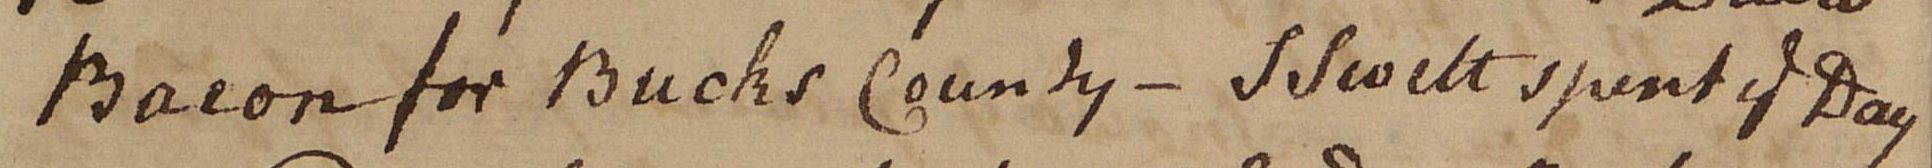Bacon for Bucks County- S Swett spent y^e Day
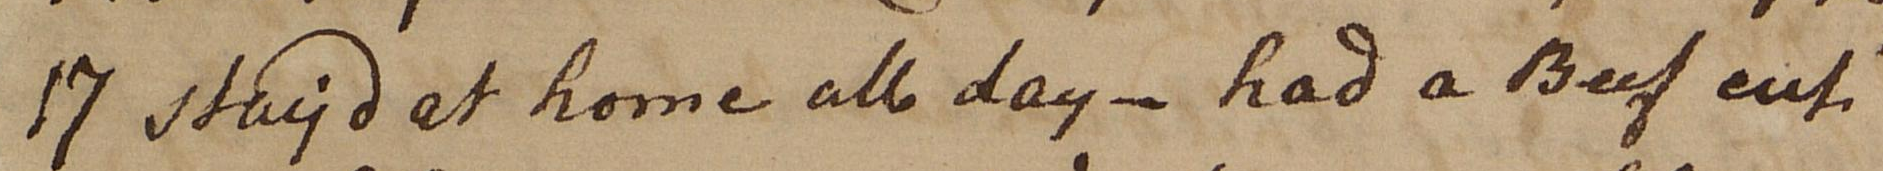17 stay'd at home all day- had a Beef cut
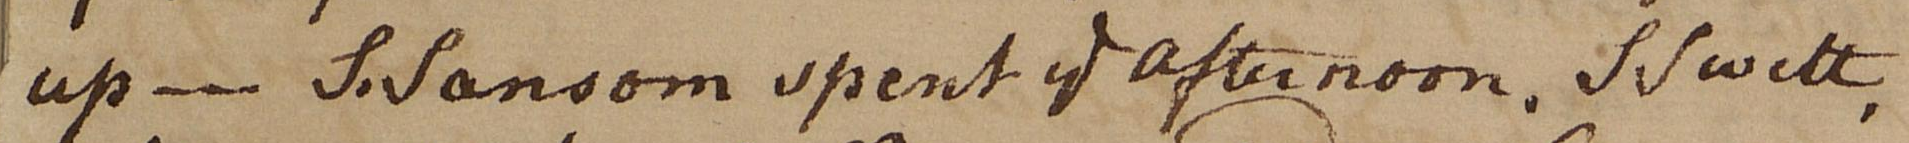up- S.Sansom spent y^e Afternoon. S Swett,
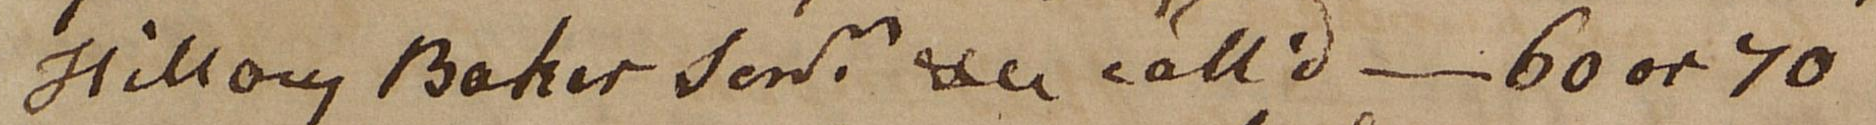Hillory Baker Sen^r. &c call'd-60 or 70
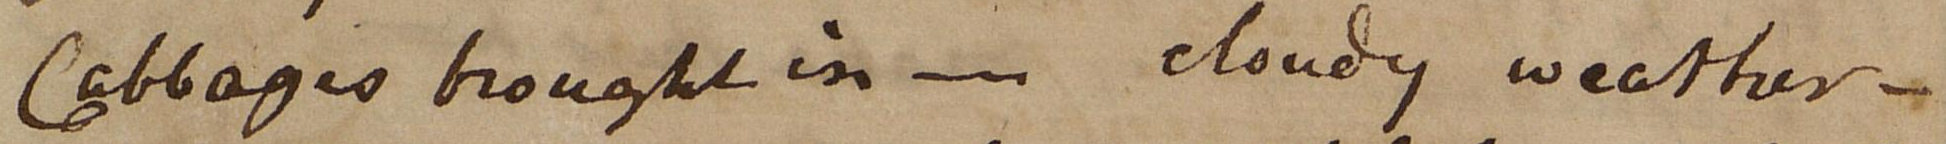Cabbages brought in- cloudy weather-
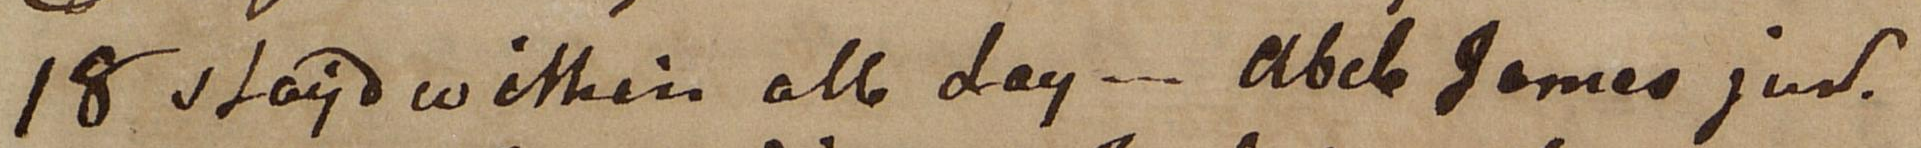18 stay'd within all day- Abel James jun^r.
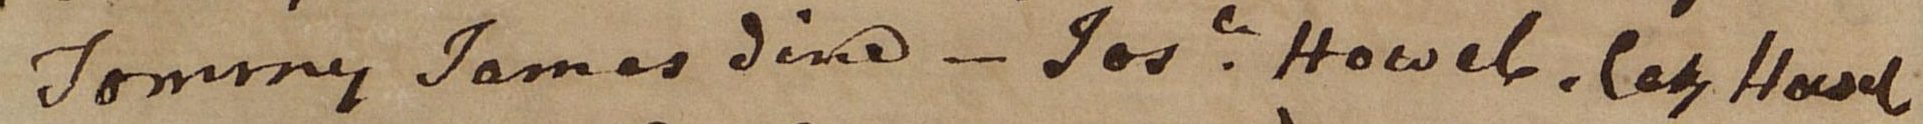Tommy James dind- Jos^a. Howel. Caty Howel
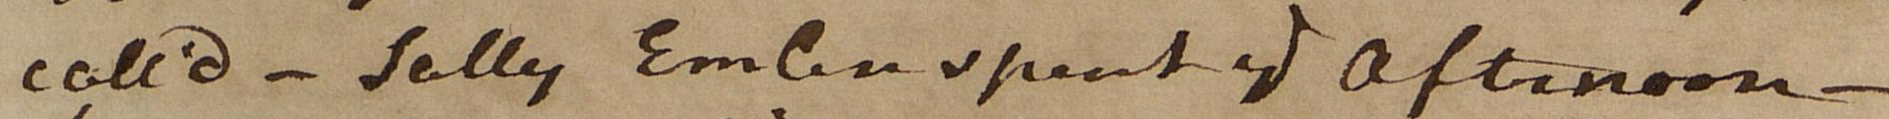call'd- Sally Emlen spent y^e Aftrnoon-
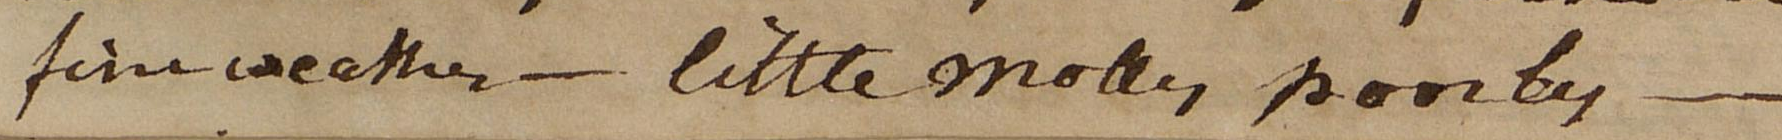fine weather- little Molly poorly-
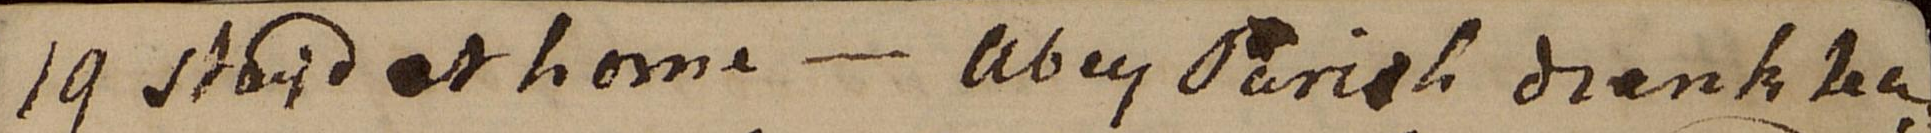19 stay'd at home- Abey Parish drank tea
